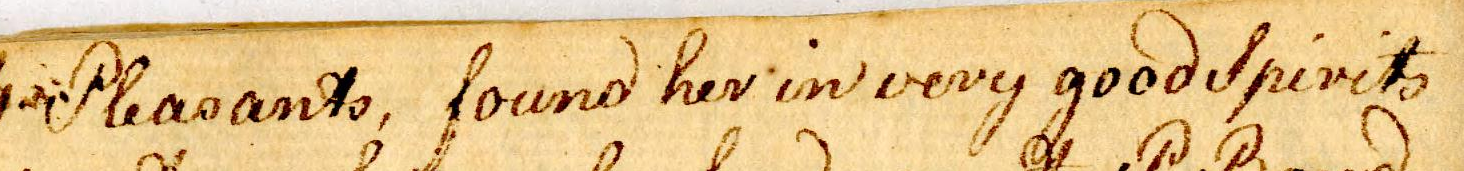Pleasants, found her in very good Spirits
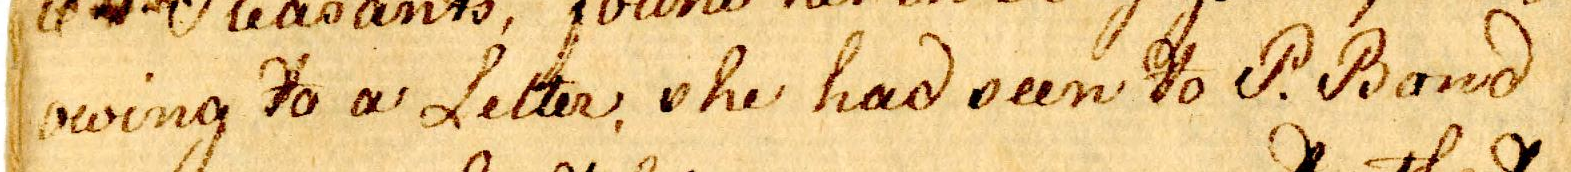owing to a Letter, she had seen to P. Band
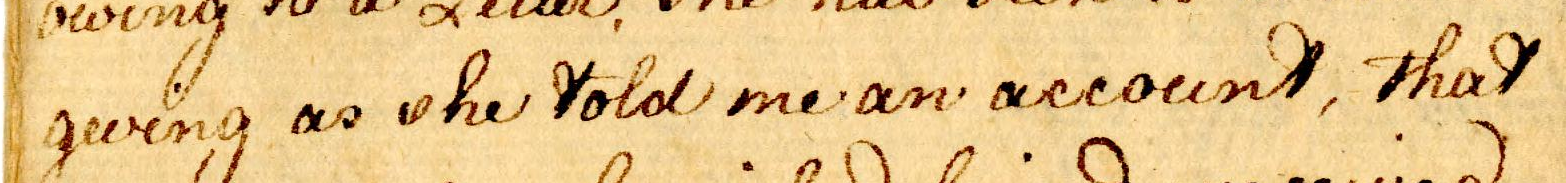giving as she told me an account, that
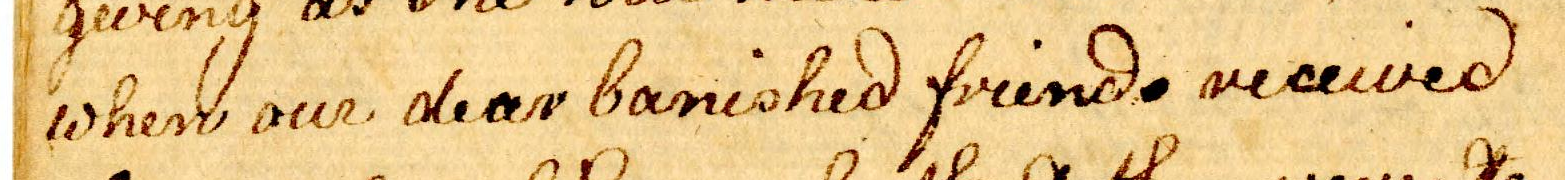when our dear banished friends received
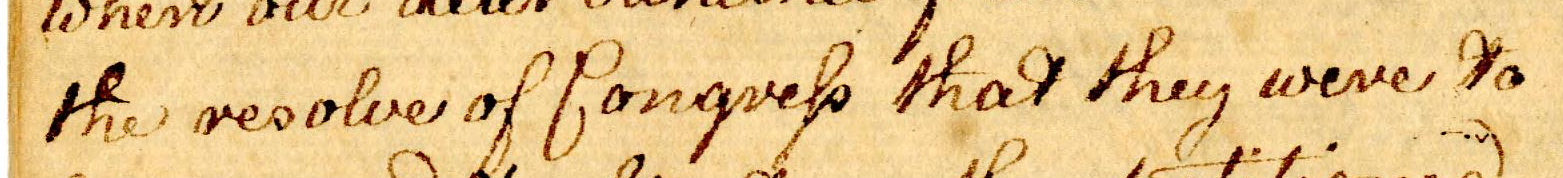the resolve of Congress that they were to
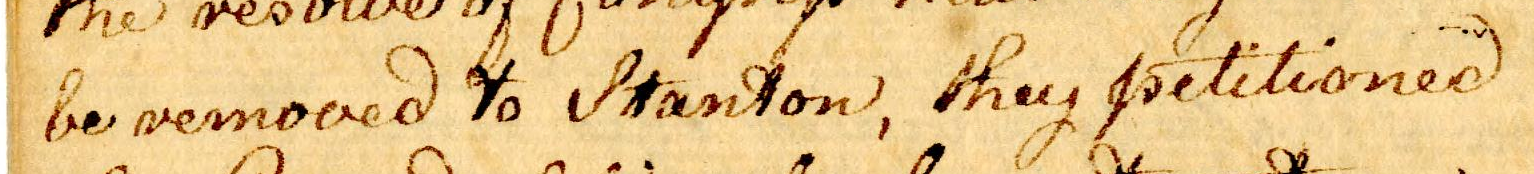be removed to Stanton they petitioned
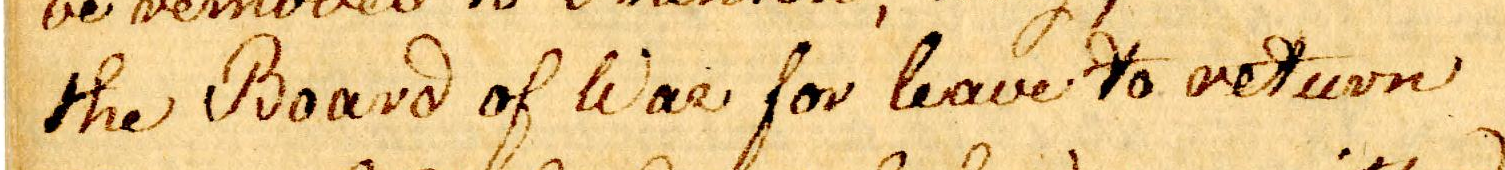the Board of War for leave to return
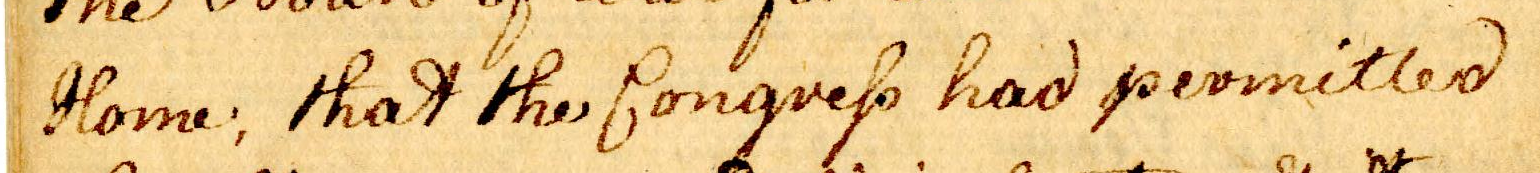Home, that the Congress had permitted
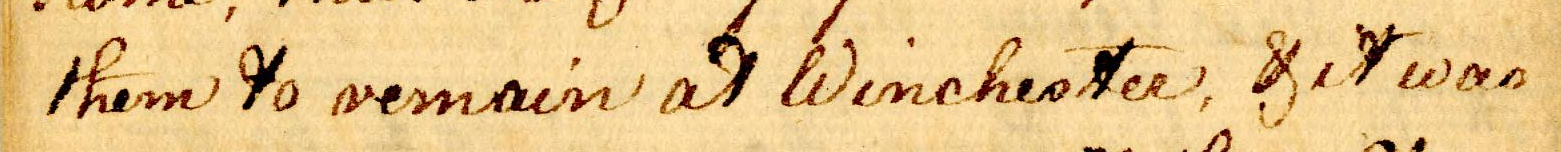them to remain at Winchester, & it was
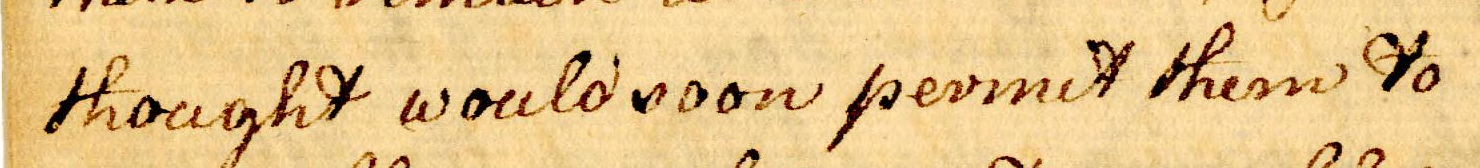thought would soon permit them to
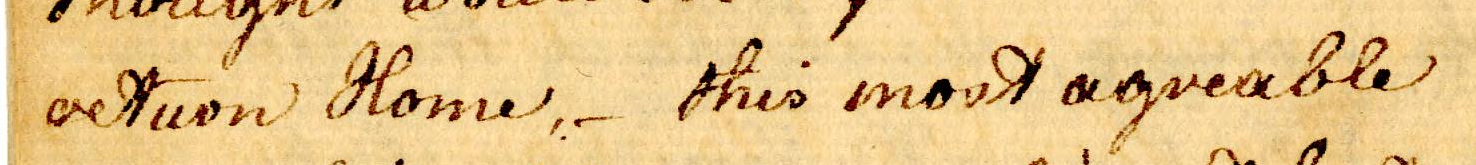return Home,- this most agreable
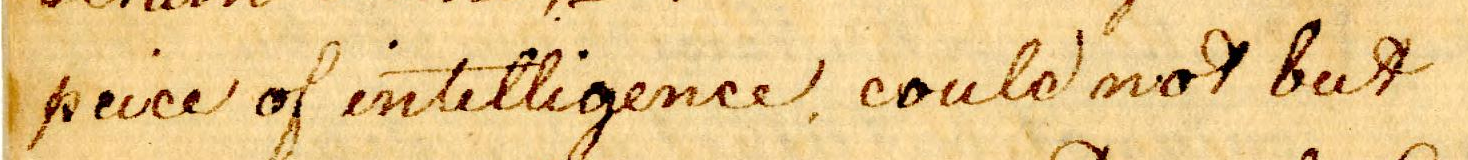peice of intelligence could not but
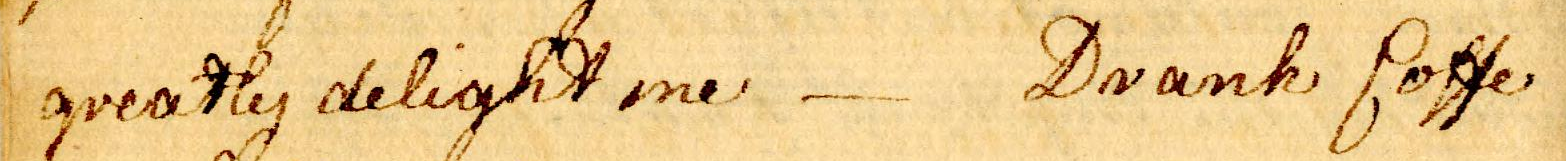greatly delight me- Drank Coffe
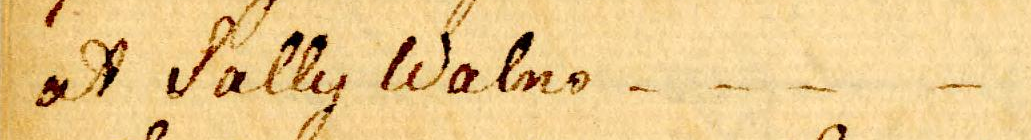at Sally Walns--
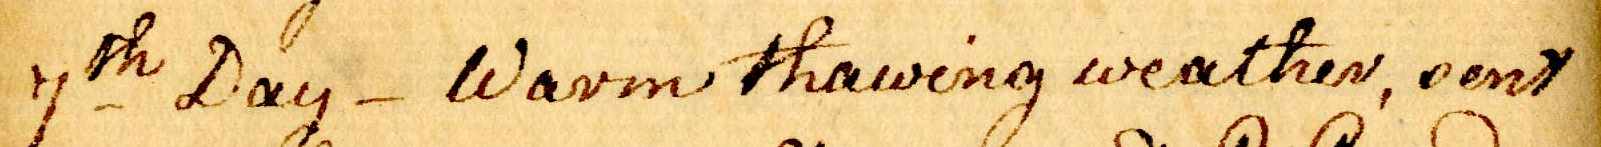7^th Day- Warm thawing weather, sent
